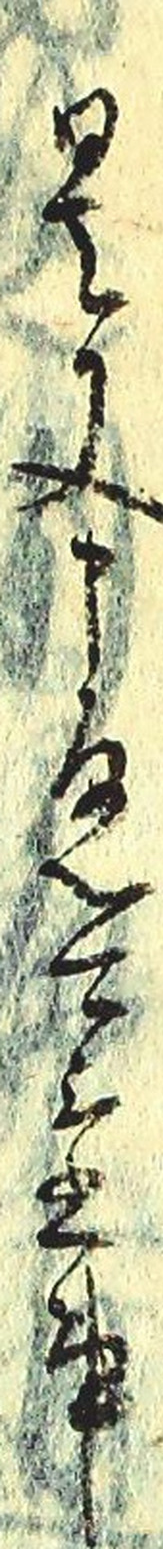是又申通可置事
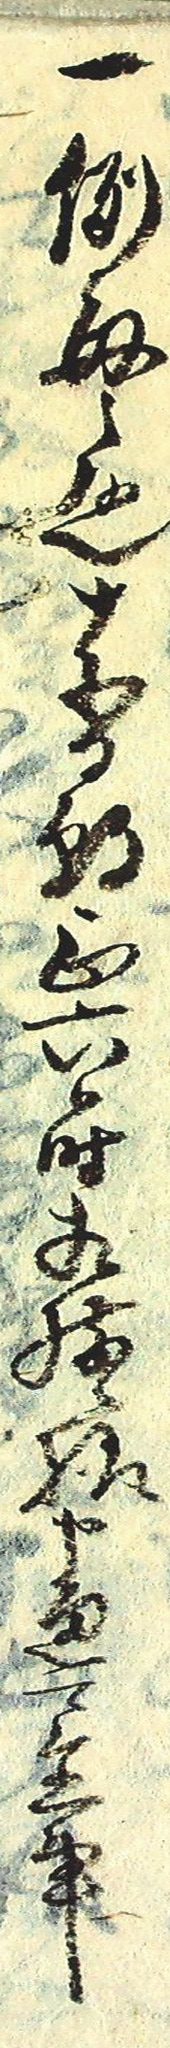一例毎之通十五日朝正六つ時相揃候様申通可置事
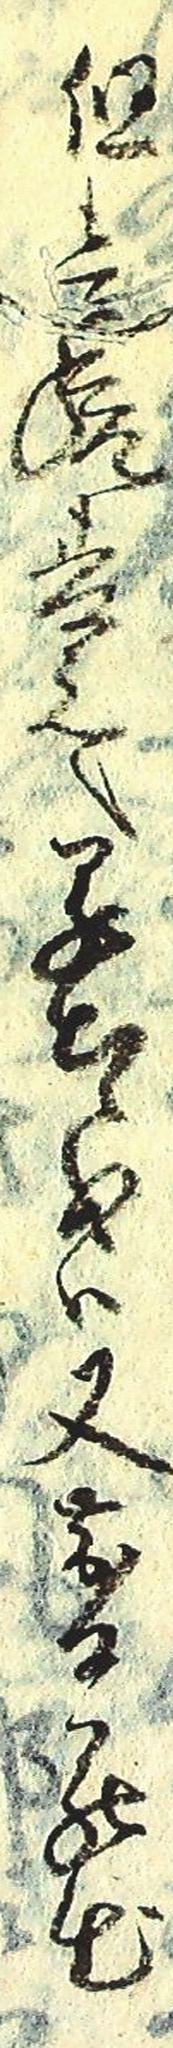但寺院爰元へ罷出候義は又前日罷出
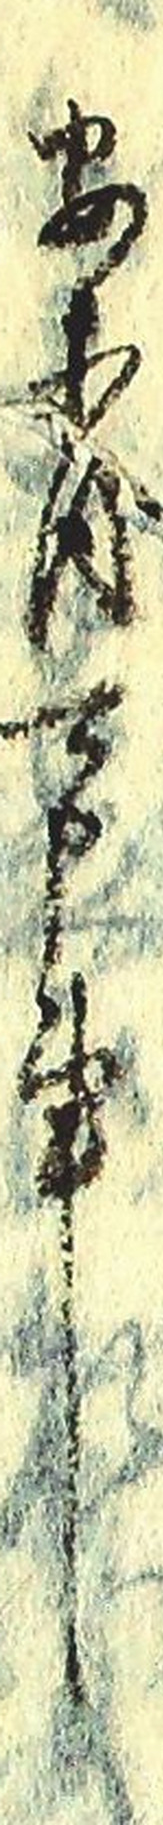案内可申事
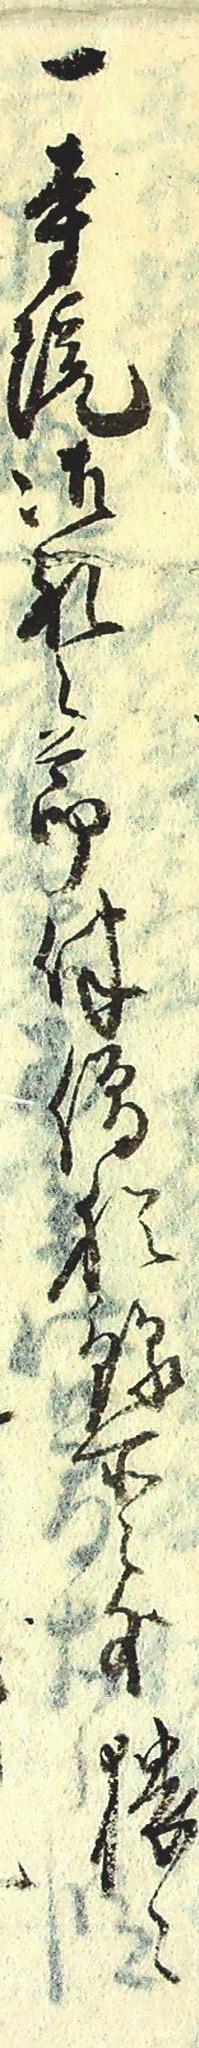一寺院御礼之節伴僧猶予所之外猥に
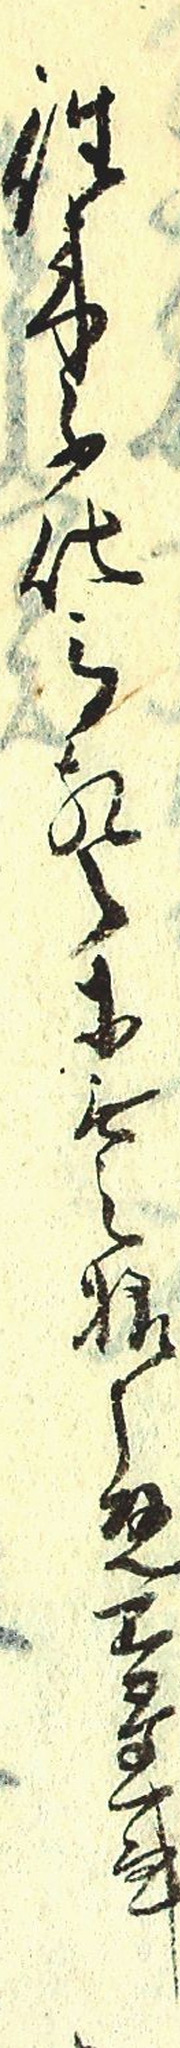往来不仕高声等無之様申通可置事
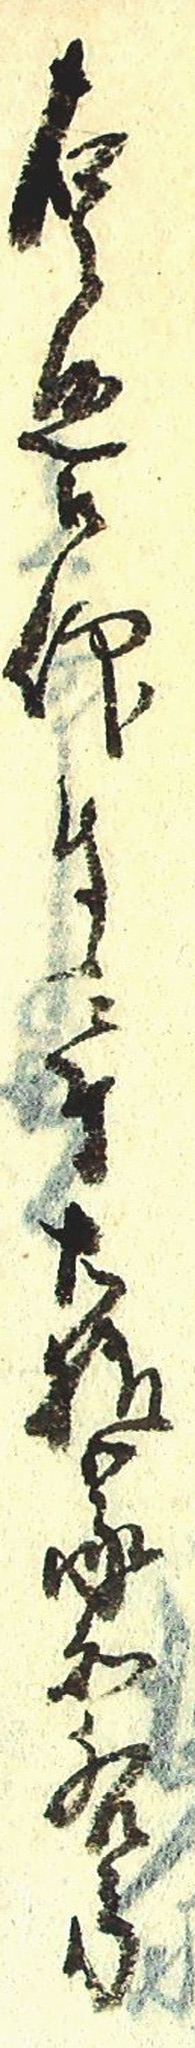右之通被仰付に付左様御承知各方
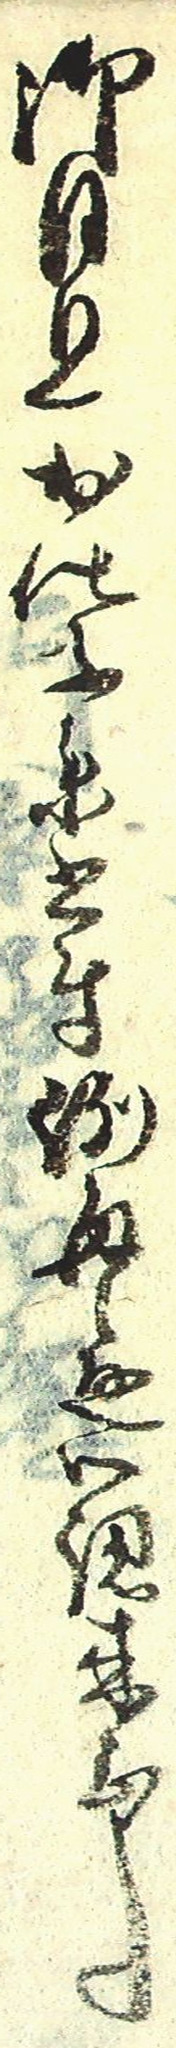御目見出仕不参書付例毎之通御認来正月
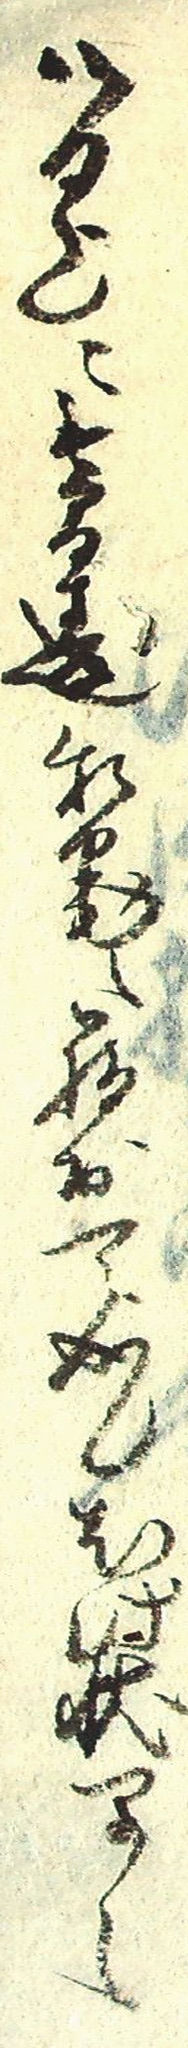八日迄に無間違私宅へ御指出可被成候尤此状早々

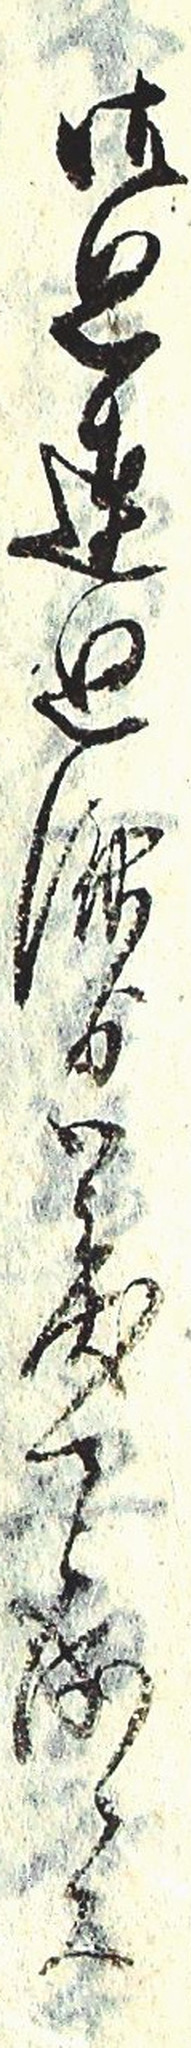御廻達廻済ゟ御戻可被成候以上
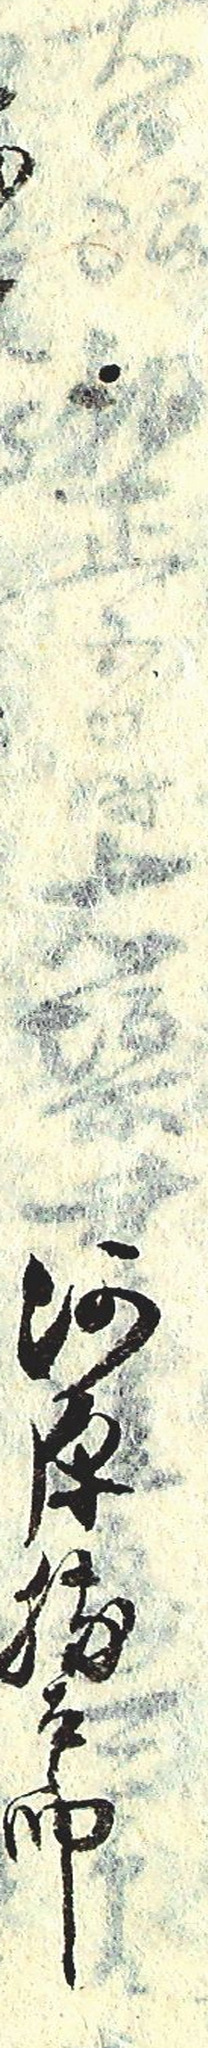河原勝太郎
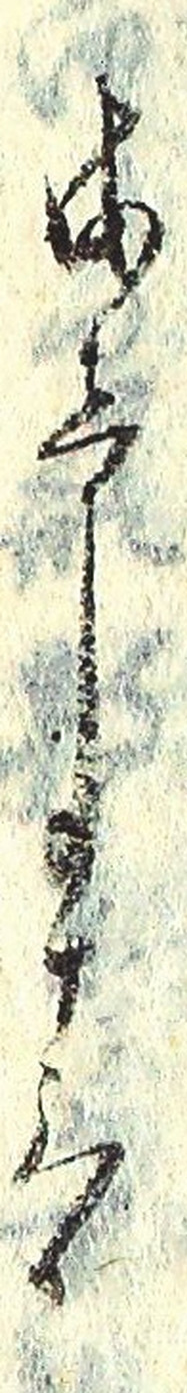戌十二月十三日
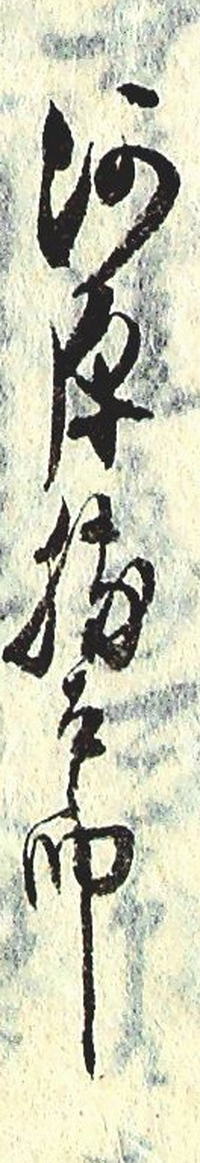河原勝太郎
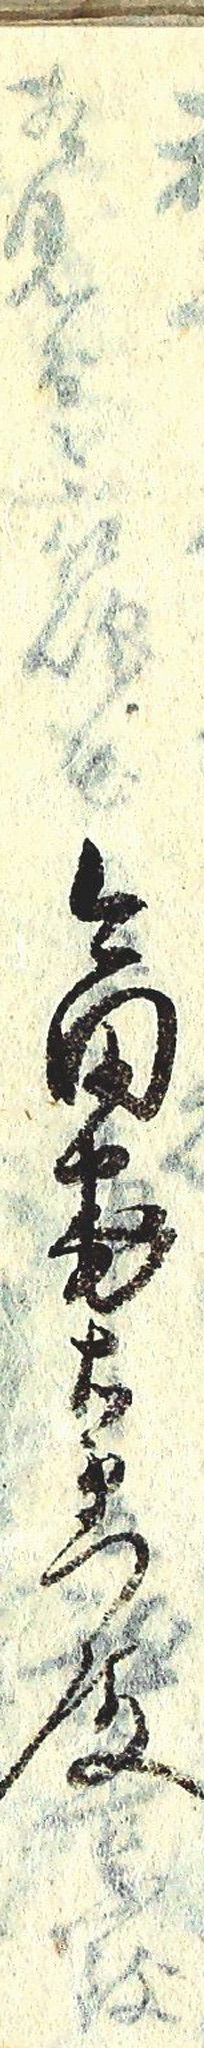今田宅右衛門殿
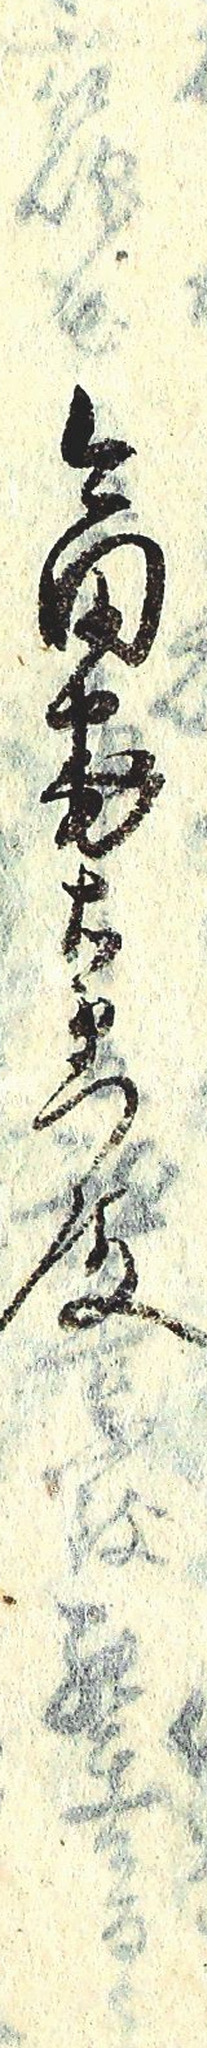今田宅右衛門殿
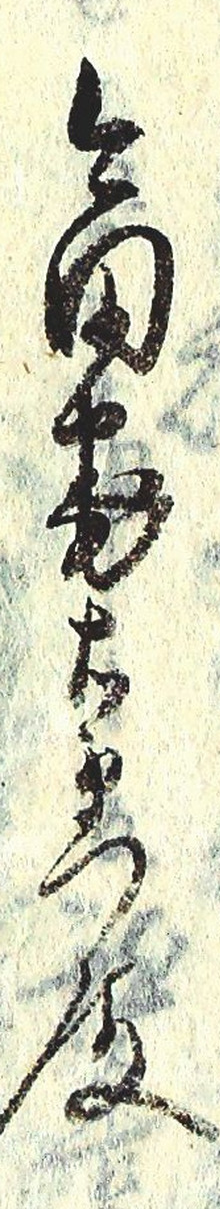今田宅右衛門殿
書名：諸御願書控(弐番）
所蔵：鳴門教育大学 Naruto University of Education
